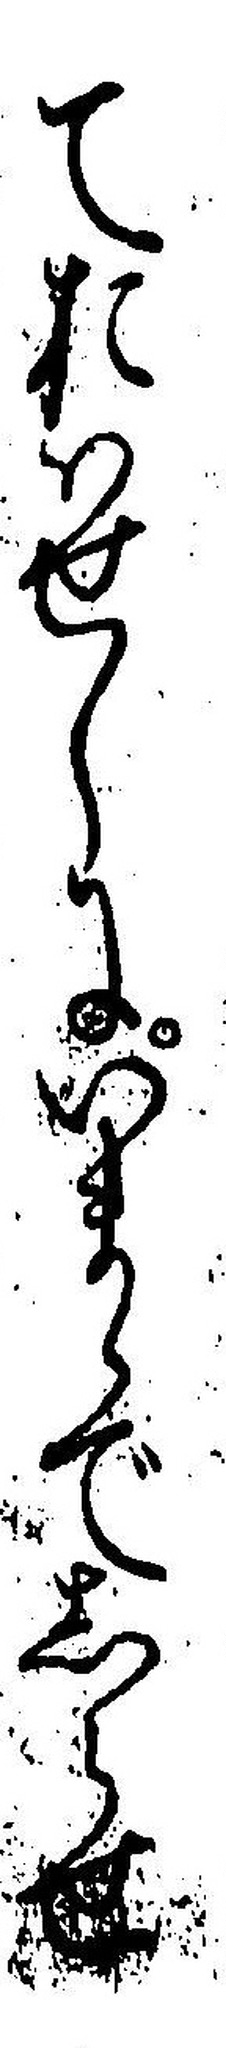ておはせしに。いまゝでしらせ
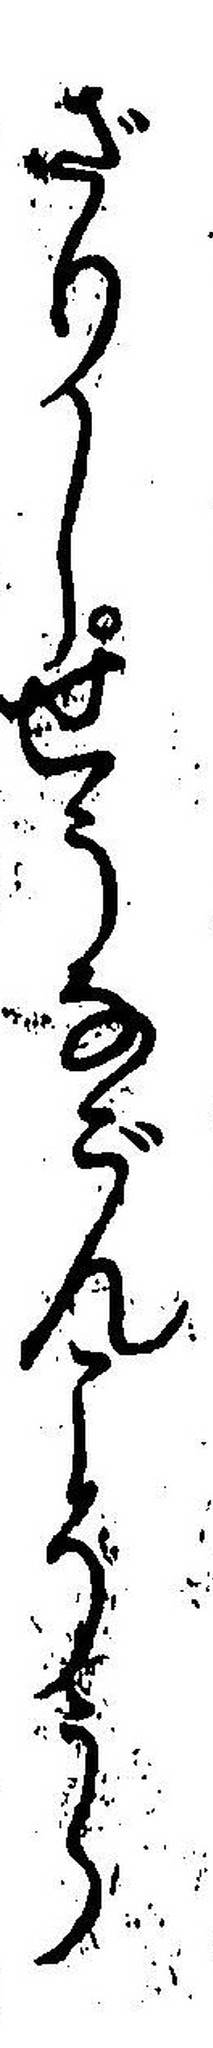ざりし。せうなごんこそうら
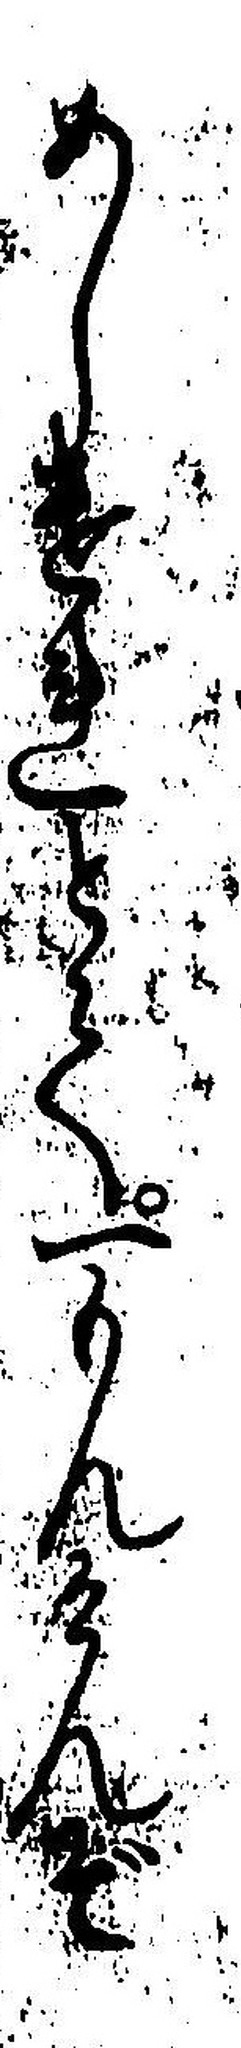めしけれとて。一もんけんぞ

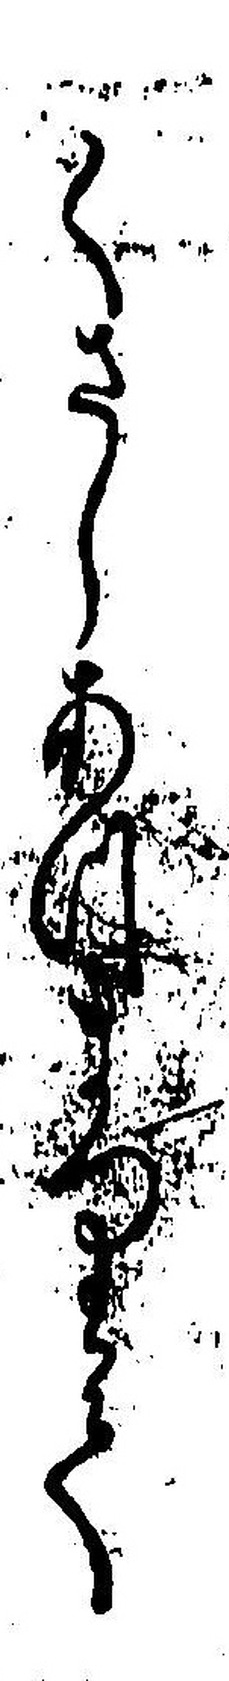くさしあつまりて
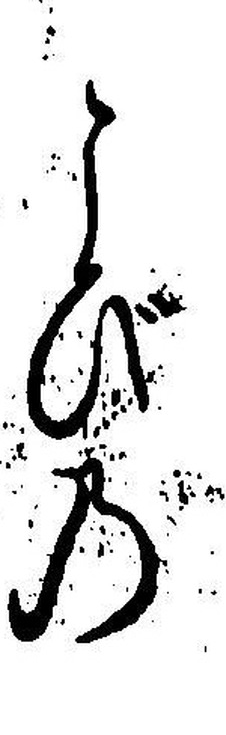こびの
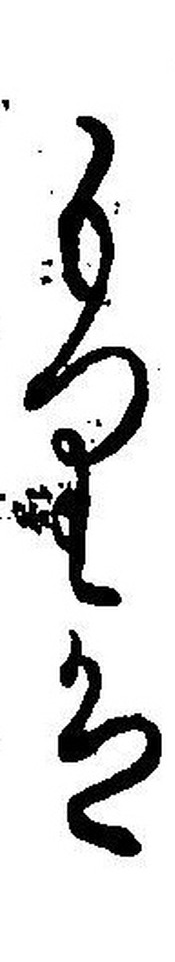もりは
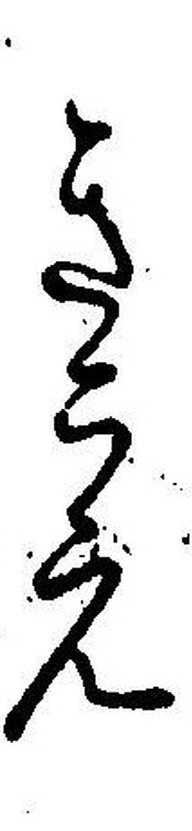きこえ

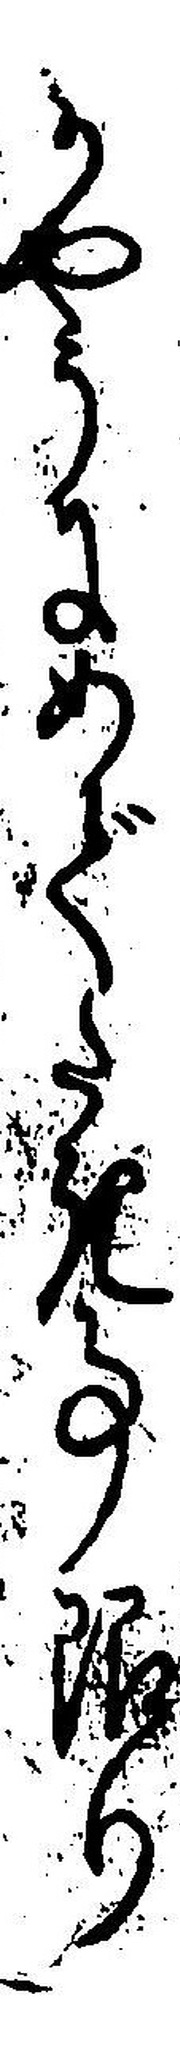かやうにめでたき事限り
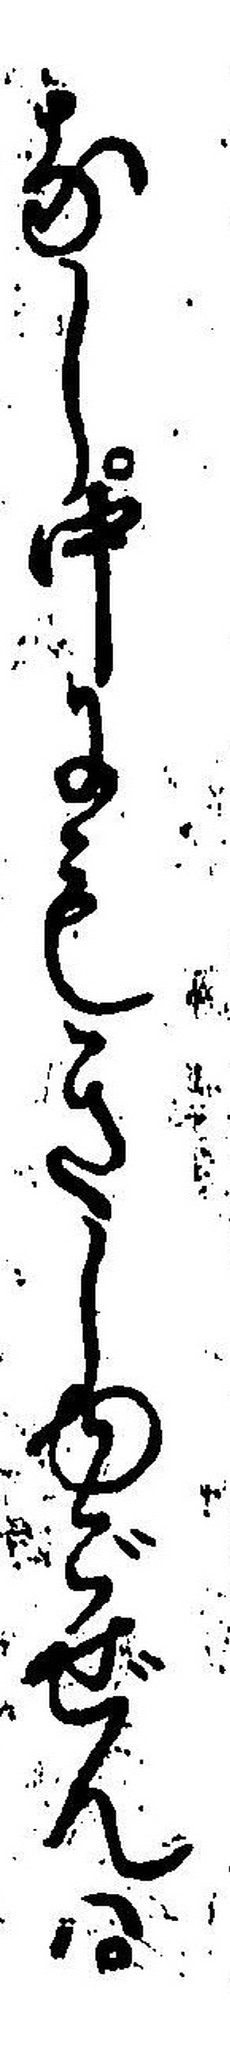なし。中にもきしゆごぜんは。
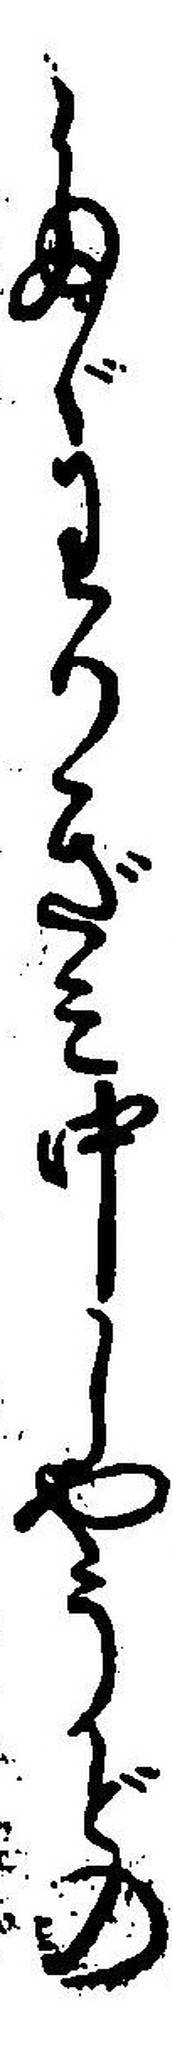たゞわかぎみ中しやうどの
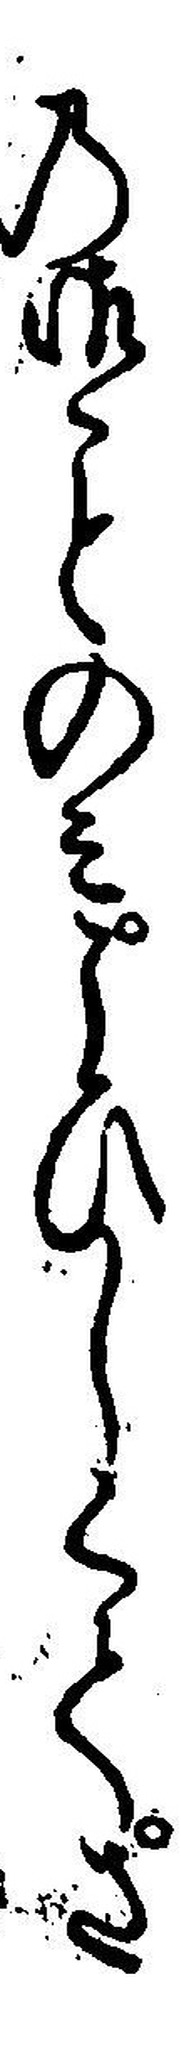の御ことのみ。こひしくて。さ
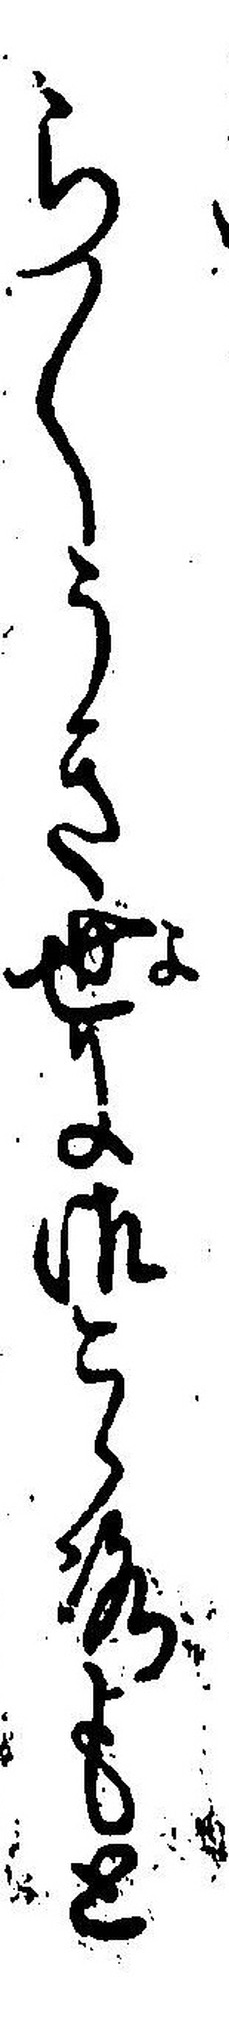ら〳〵うき世に御こゝろもと
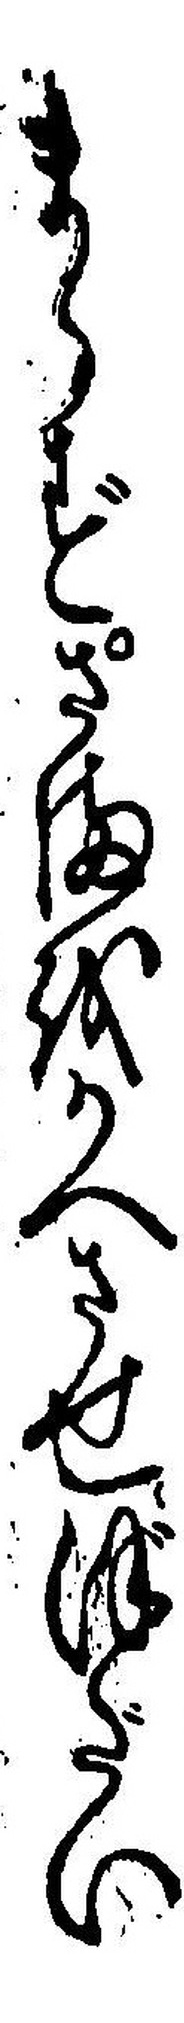まらず。さまをかへさせぼだい
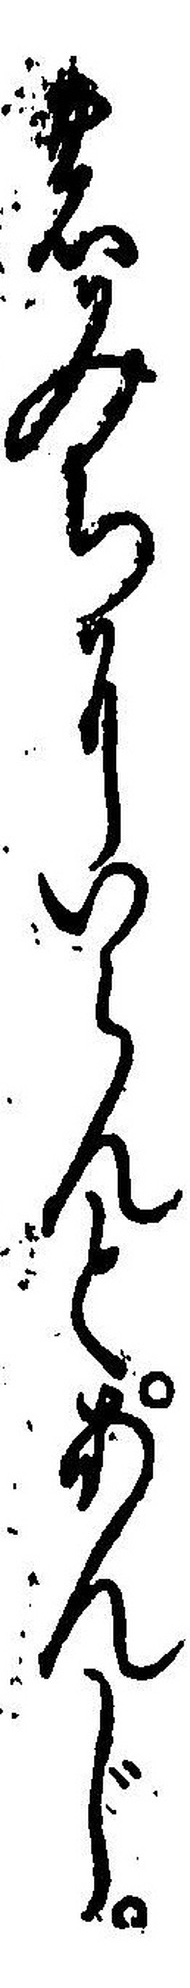のみちにいらんと。あんじ。
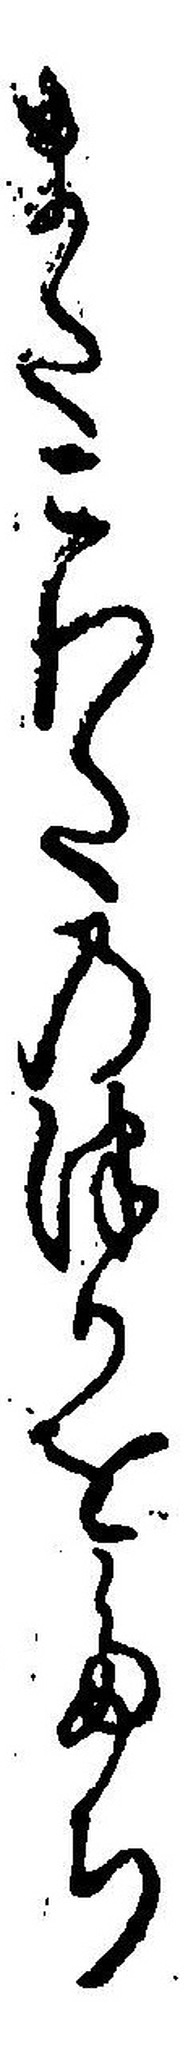またこわたのつかをたち
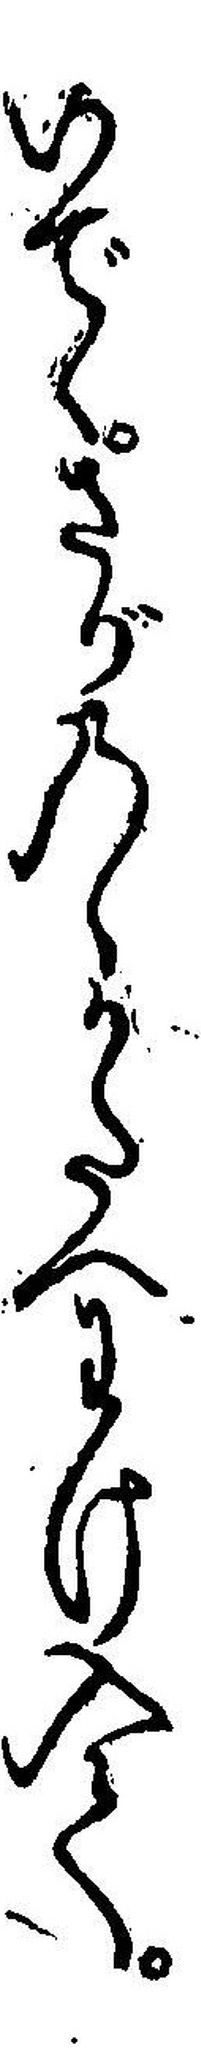いでゝ。さがのゝかたへわけ入て。
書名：木幡きつね
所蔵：東京大学総合図書館 General Library in the University of Tokyo, JAPAN
